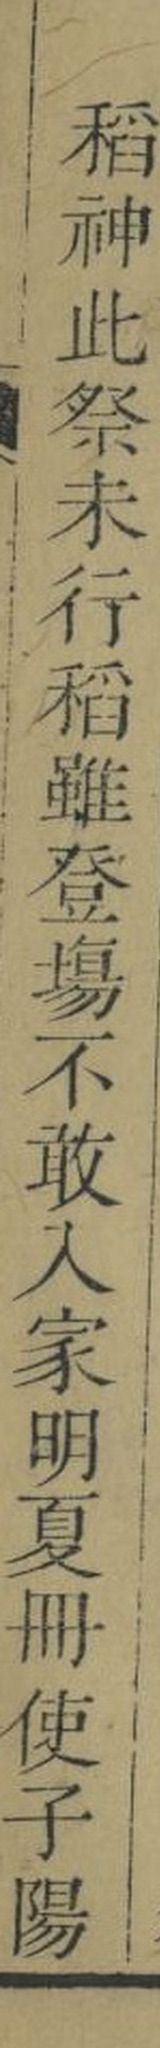稲神此祭未行稲雖登場不敢入家明夏冊使子陽

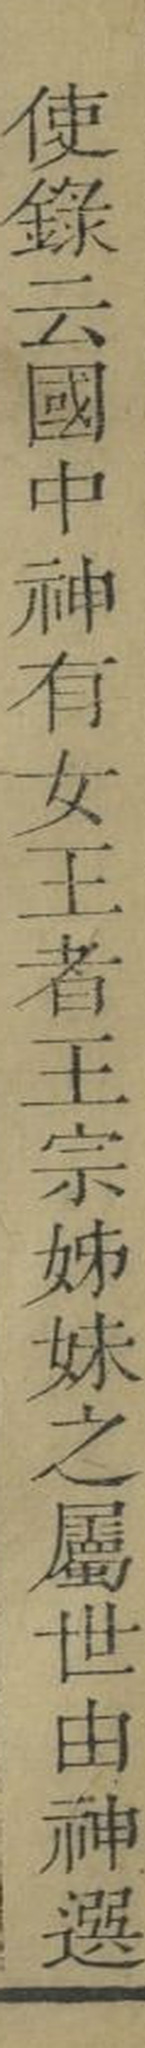使録云国中神有女王者王宗姉妹之属世由神選
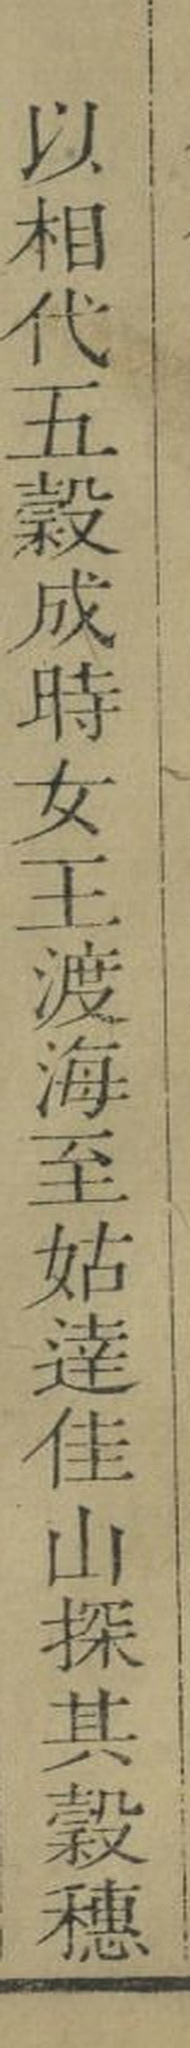以相代五穀成時女王渡海至姑達佳山探其穀穂
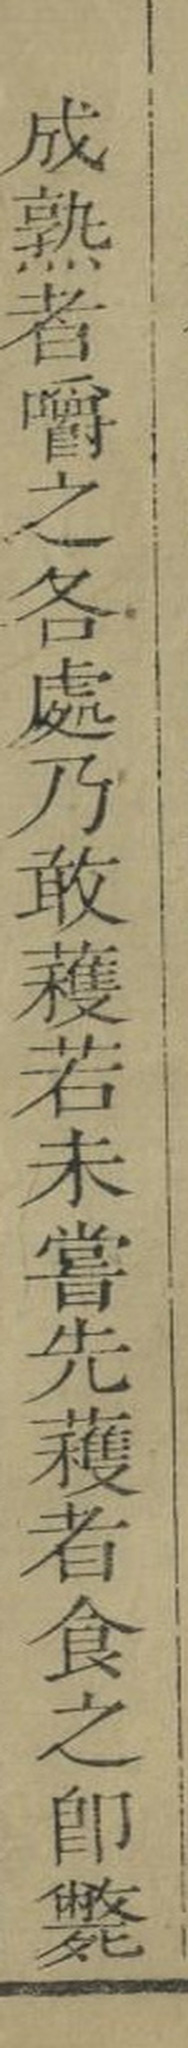成熟者嚼之各処乃敢穫若未嘗先穫者食之即斃
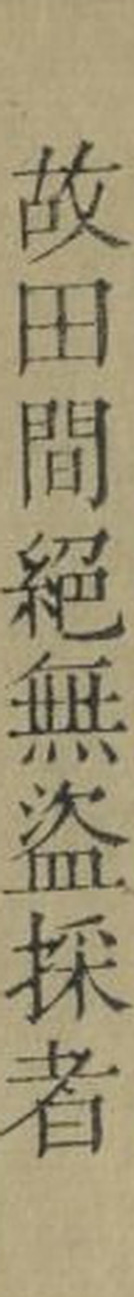故田間絶無盗採者
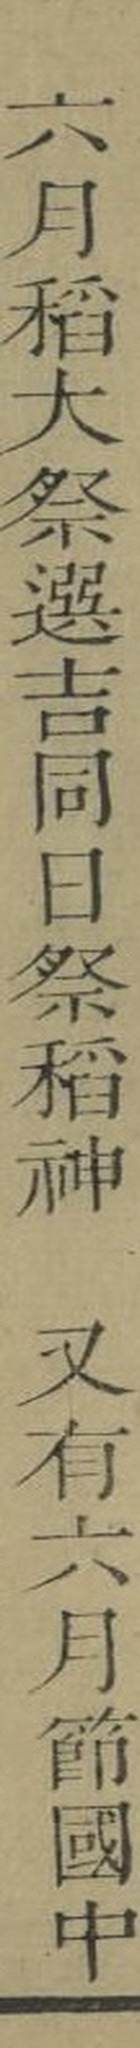六月稲大祭選吉同日祭稲神又有六月節国中
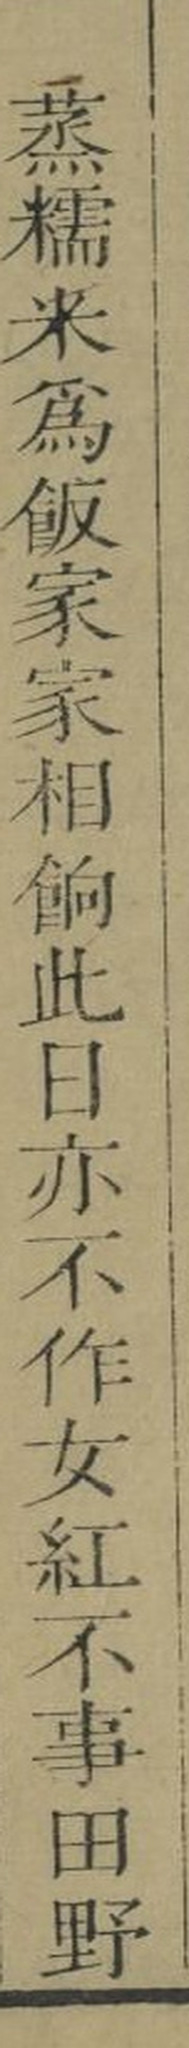蒸糯米為飯家家相餉此日亦不作女紅不事田野
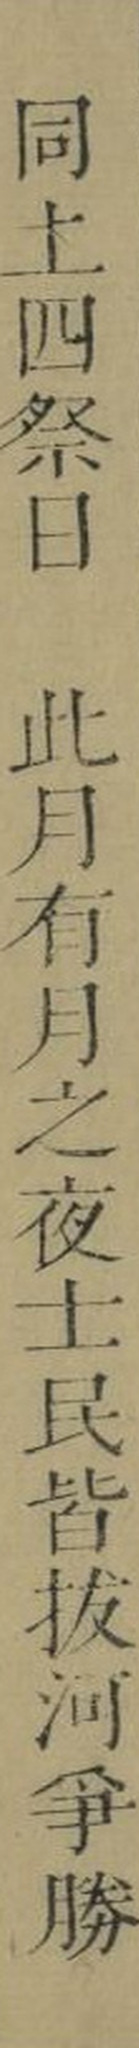同上四祭日此月有月之夜士民皆抜河争勝
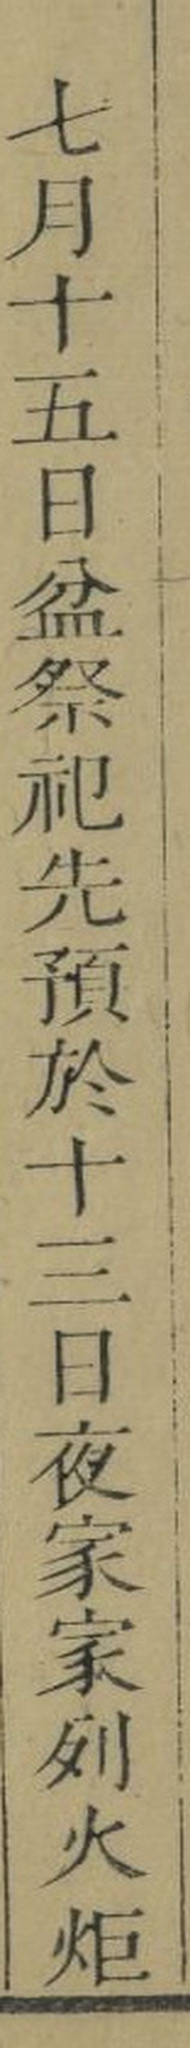七月十五日盆祭祀先預於十三日夜家家列火炬
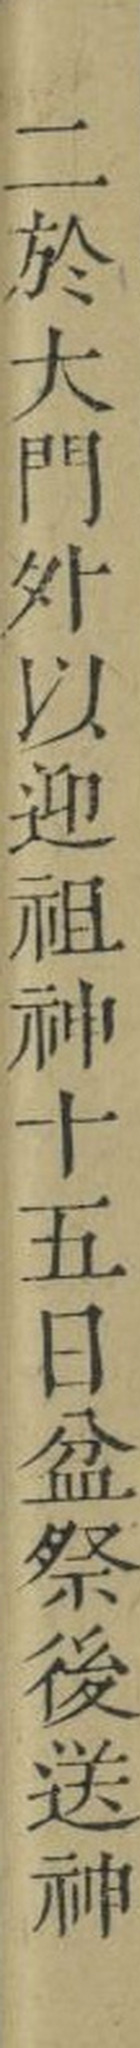二於大門外以迎祖神十五日盆祭後送神
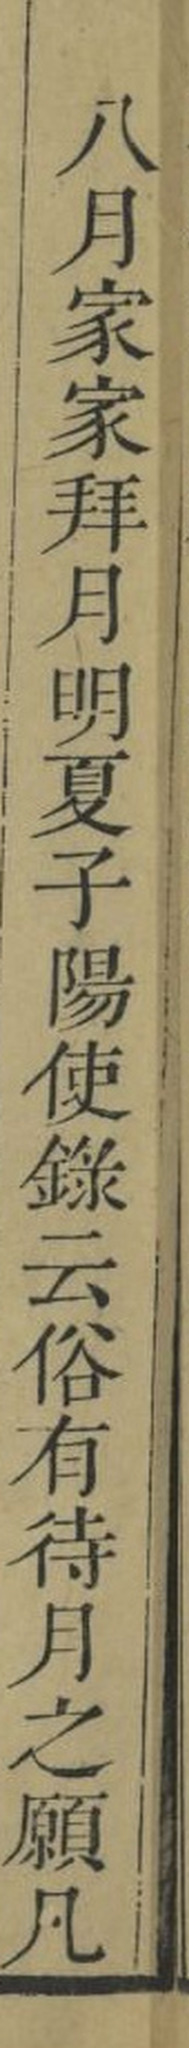八月家家拝月明夏子陽使録云俗有待月之願凡
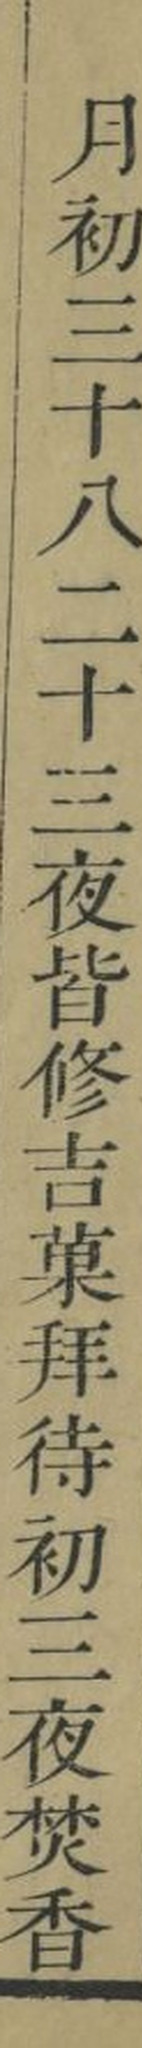月初三十八二十三夜皆修吉菓拝待初三夜焚香
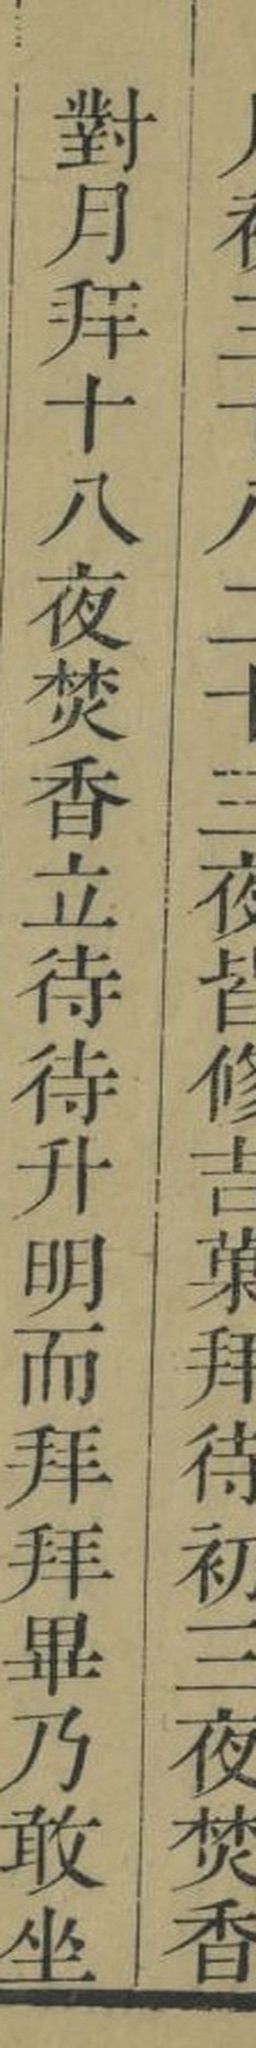対月拝十八夜焚香立待待升明而拝拝畢乃敢坐
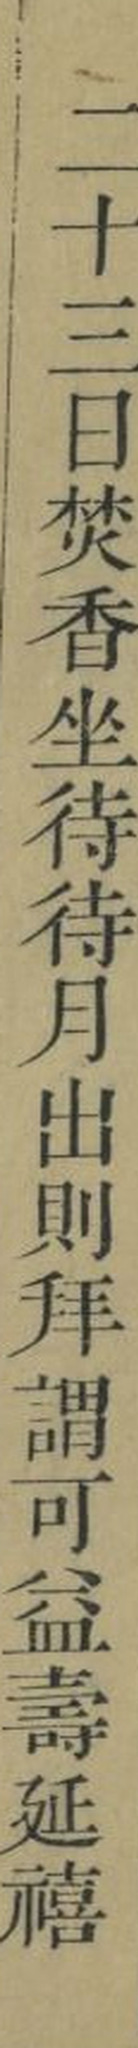二十三日焚香坐待待月出則拝謂可益寿延禧
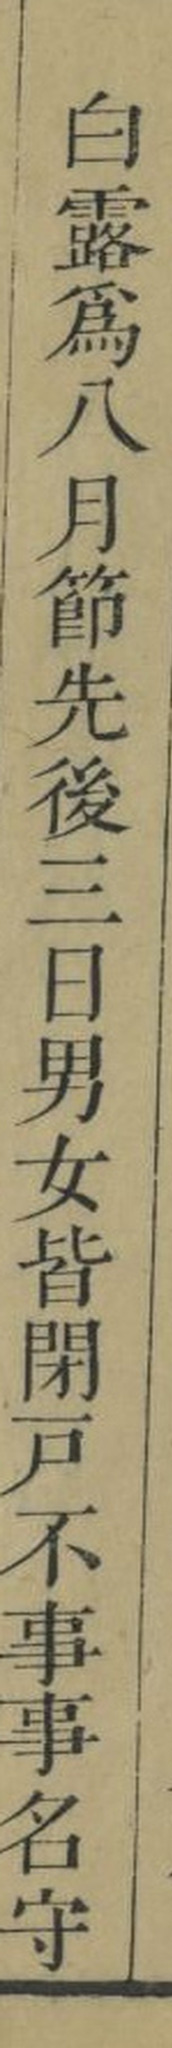白露為八月節先後三日男女皆閉戸不事事名守
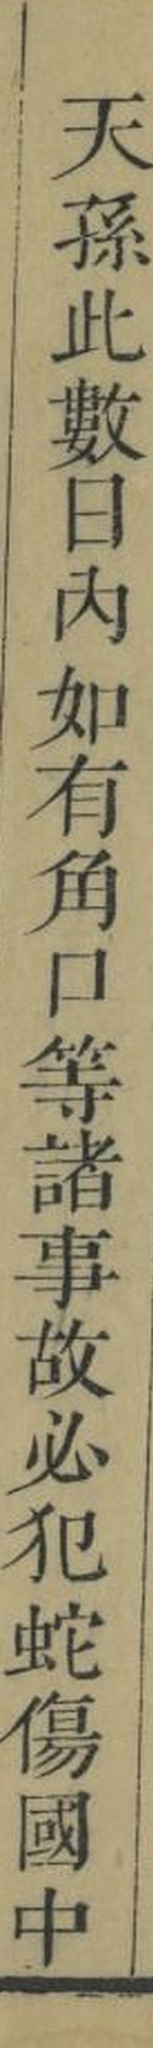天孫此数日内如有角口等諸事故必犯蛇傷国中
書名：中山伝信録 巻六
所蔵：University of the Ryukyus Library
